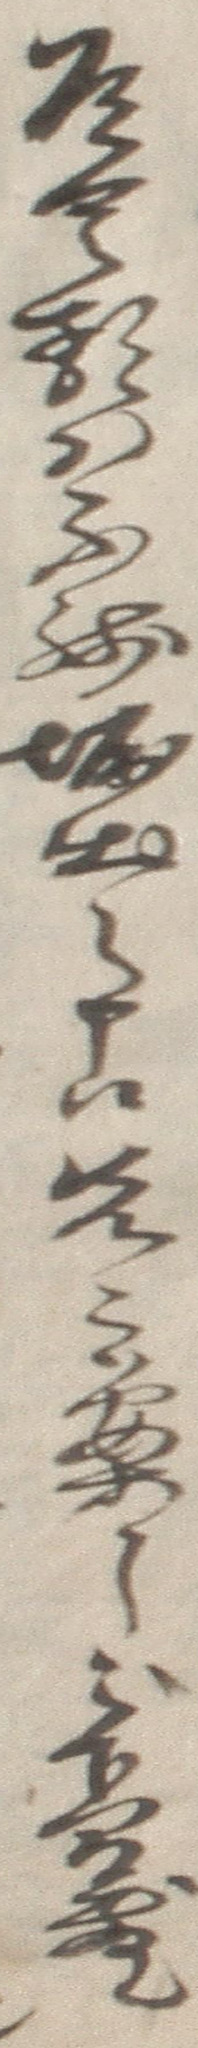道具之類ハ不残堀出し申候先々御案し被下間敷候
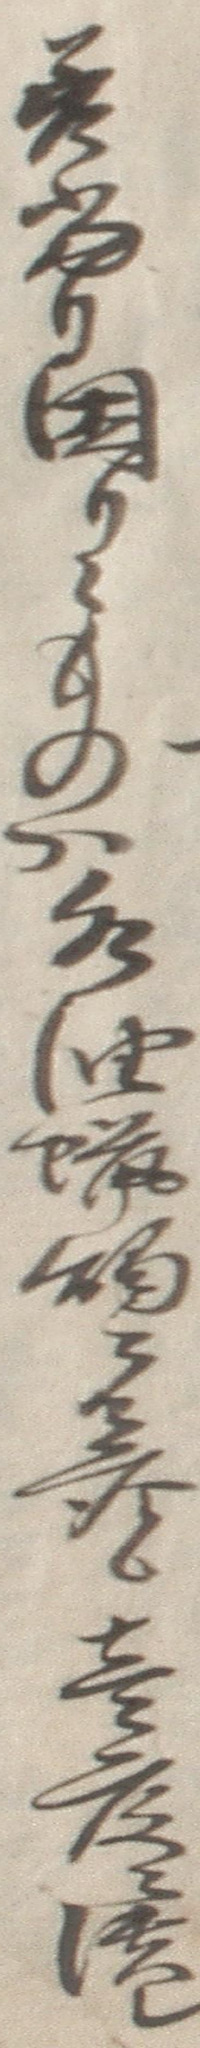差当り困り候ものハ水油蝋燭二御座候壱度二潰レ
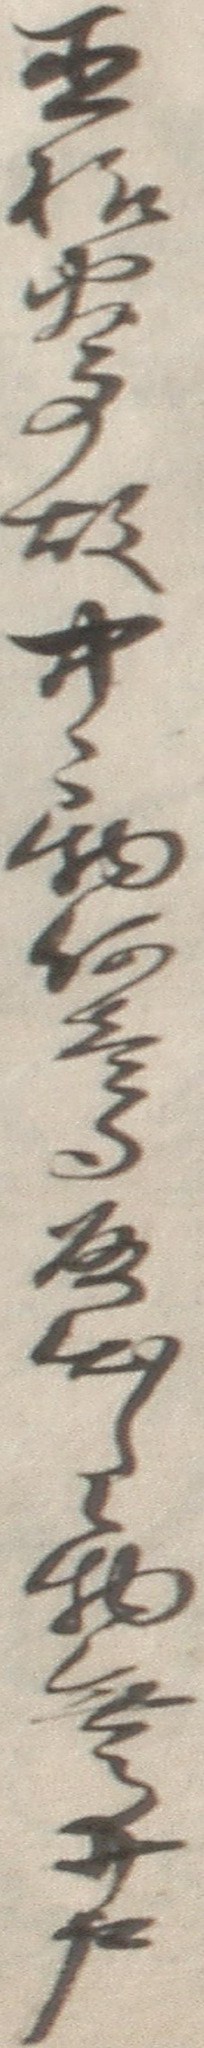直様火事故中々物壱つ取出し候物無之井戸
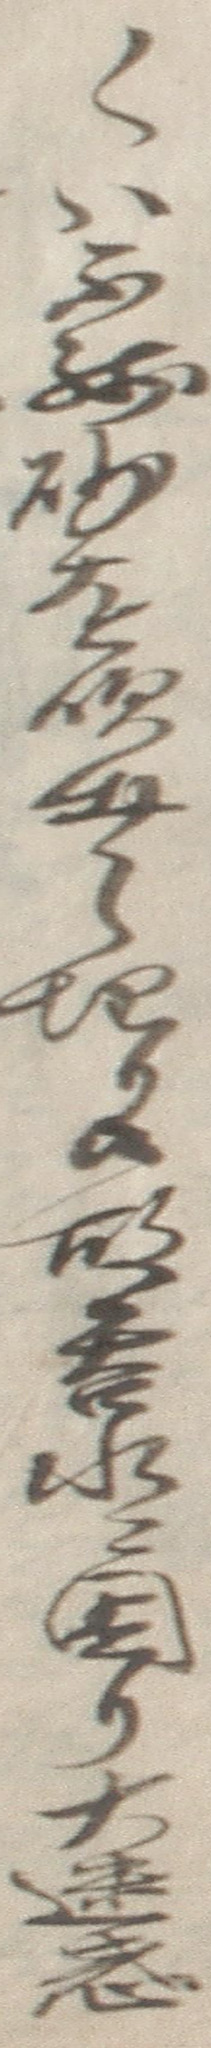〳〵ハ不残砂を吹出し埋り候故飲水二困り大迷惑
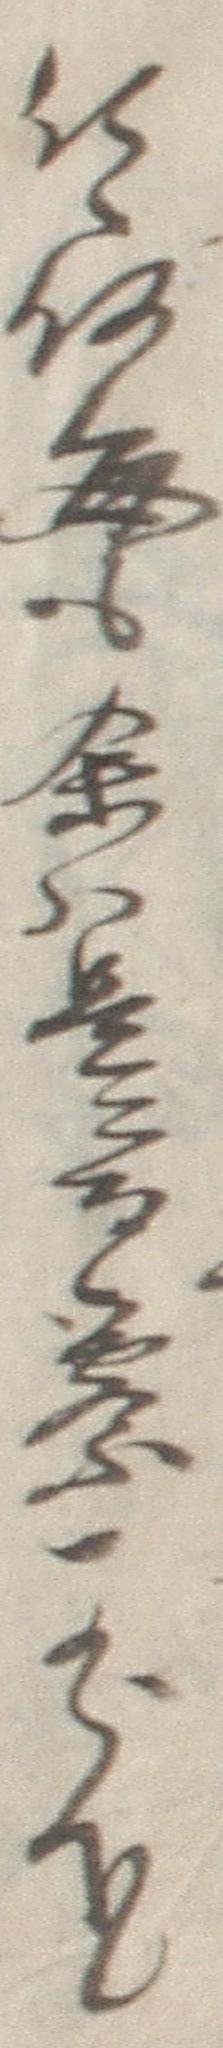仕候何毎も余ハ是二而御察可被下候

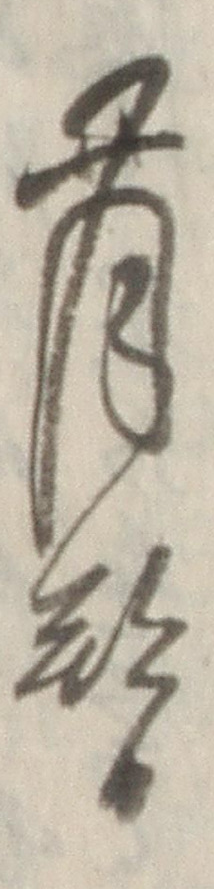五月朔日
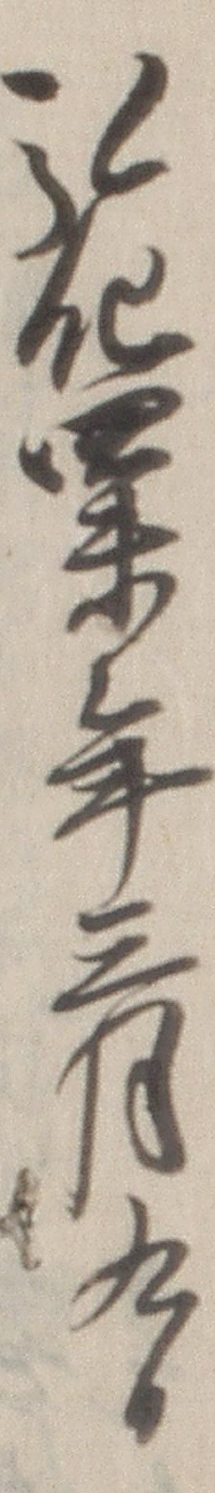弘化四未年三月九日
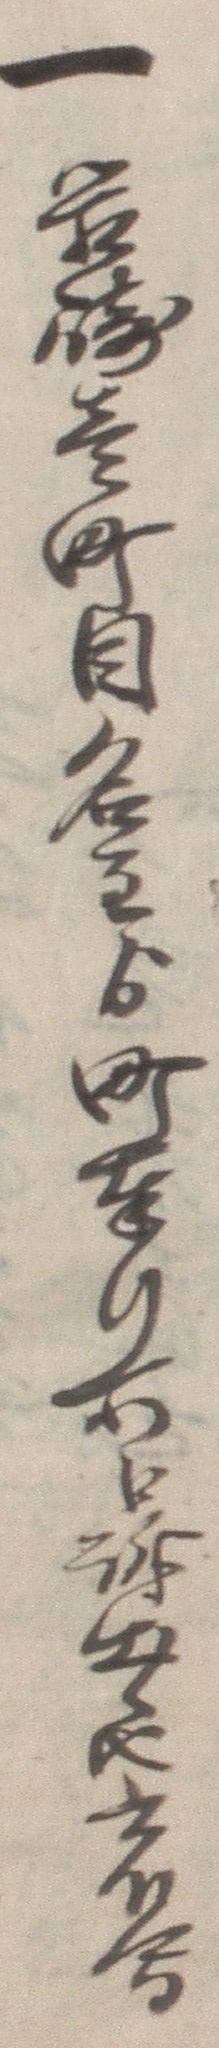一箱崎壱町目名主ゟ町奉行所江訴出候由書付写
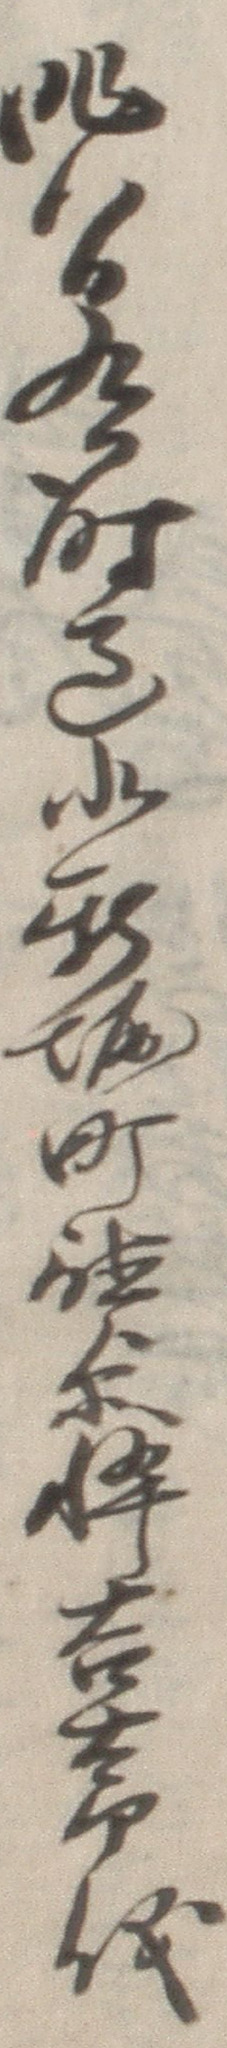昨日九ッ時過北新堀町徳兵衛忰吉太郎儀
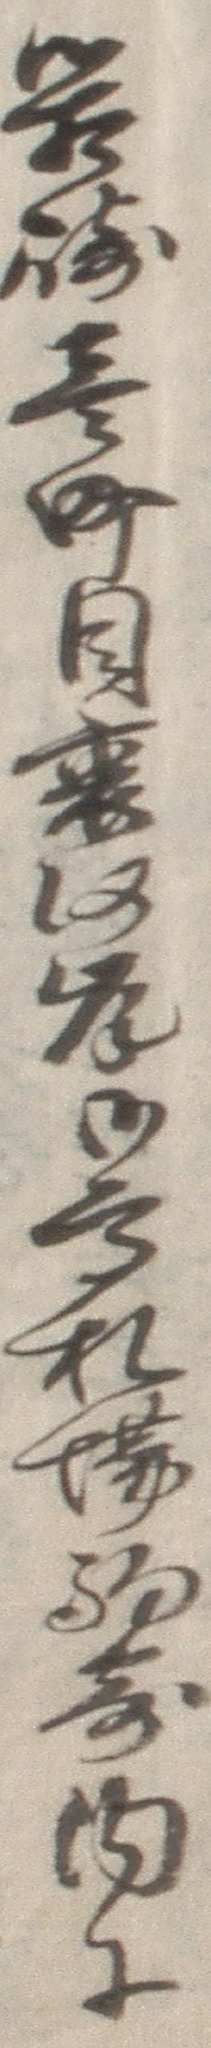箱崎壱町目裏沙汰御高札場所駒寄内に
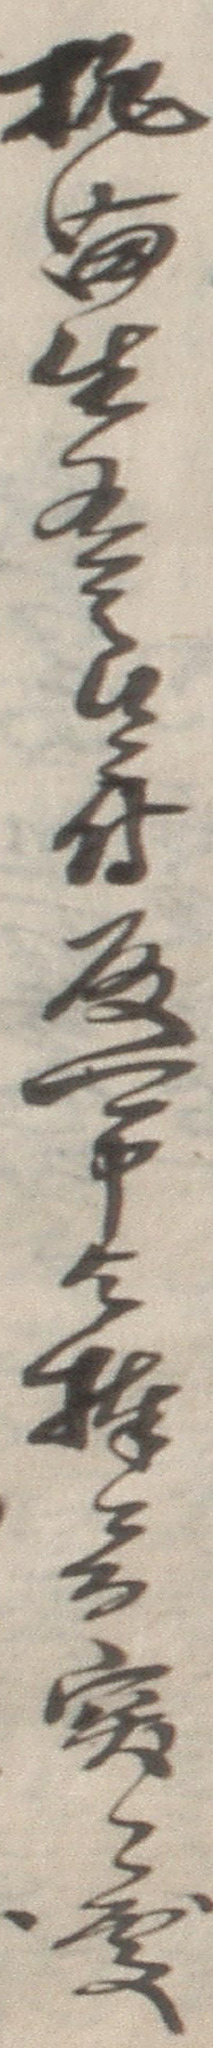抛畜生有之候二付取可申と棹二而突候処
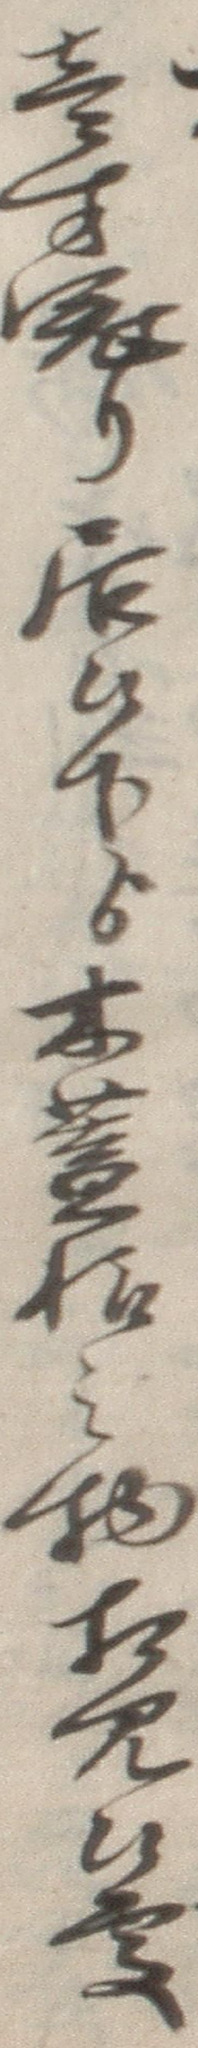壱寸冠り居候下ゟ木蓋様之物相見候処
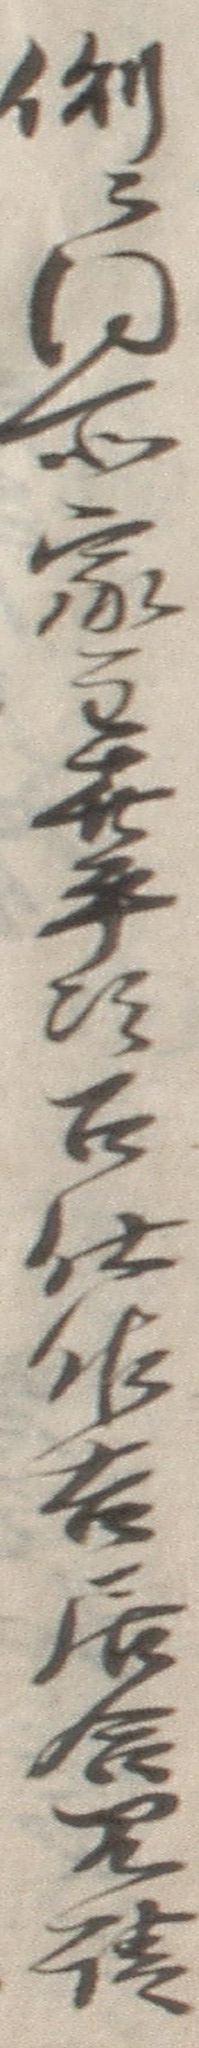側二同所家主喜平次召仕佐吉居合見積
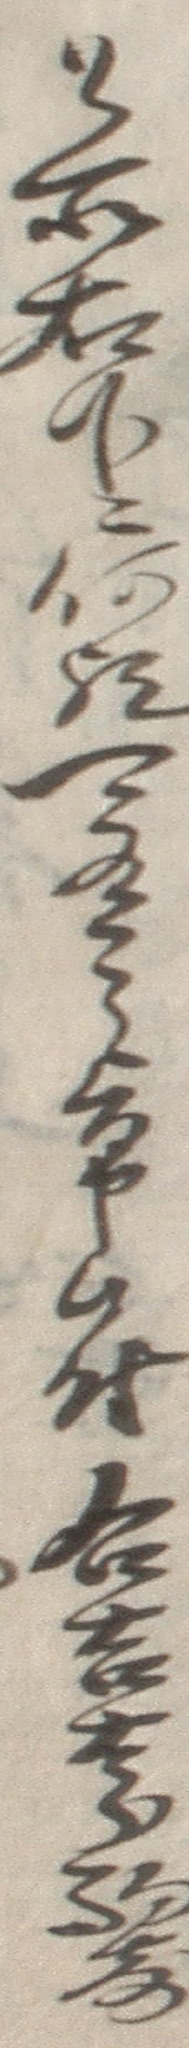候所右下二何歟可有之旨申候付右吉太郎駒寄
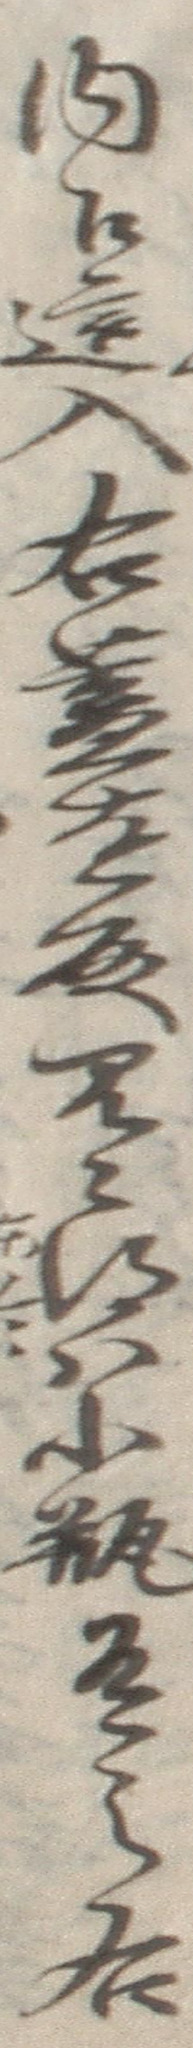内江這入右蓋を取見候ハ小瓶有之右
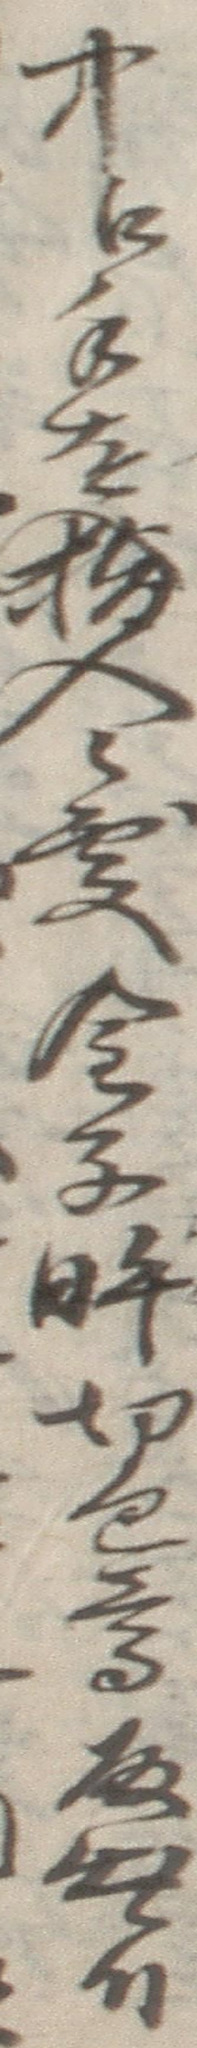中江手を指入候処金子旿切包壱ッ取出候付
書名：信州地震一件
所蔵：東京大学地震研究所図書室 Earthquake Research Institute Library, The University of Tokyo, JAPAN
